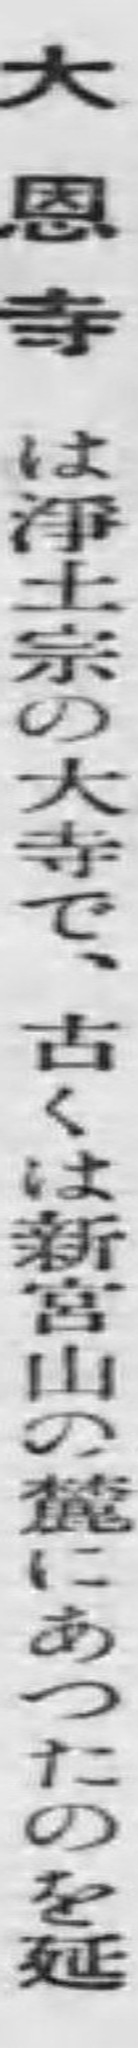大恩寺は浄土宗の大寺で、古くは新宮山の麓にあつたのを延
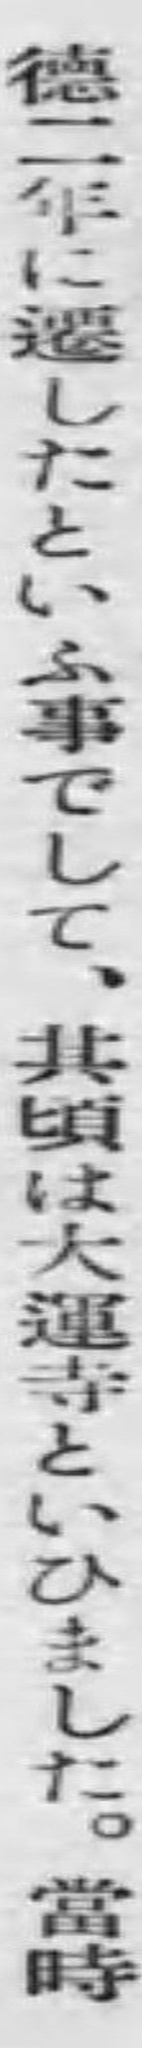徳二年に遷したといふ事でして、其頃は大運寺といひました。当時
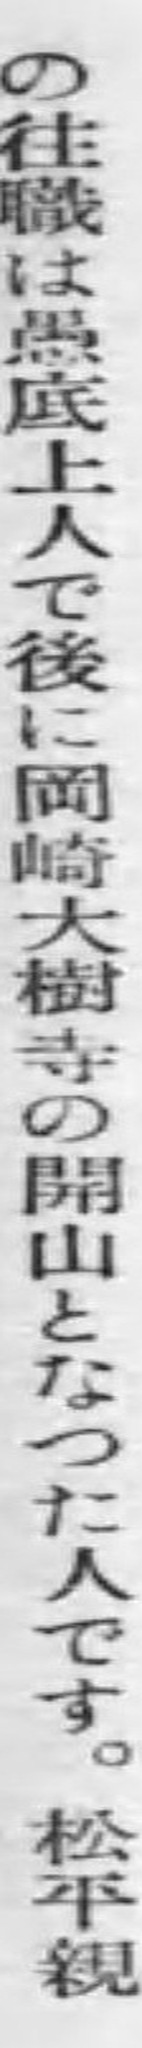の往職は愚底上人で後に岡崎大樹寺の開山となつた人です。松平親
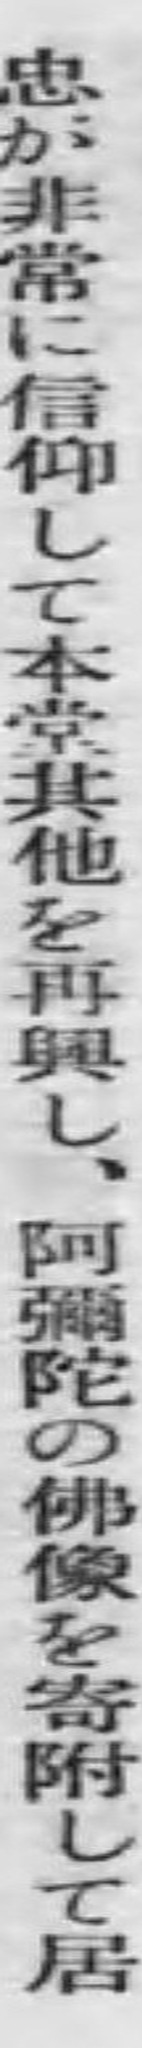忠が非常に信仰して本堂其他を再興し、阿弥陀の仏像を寄附して居
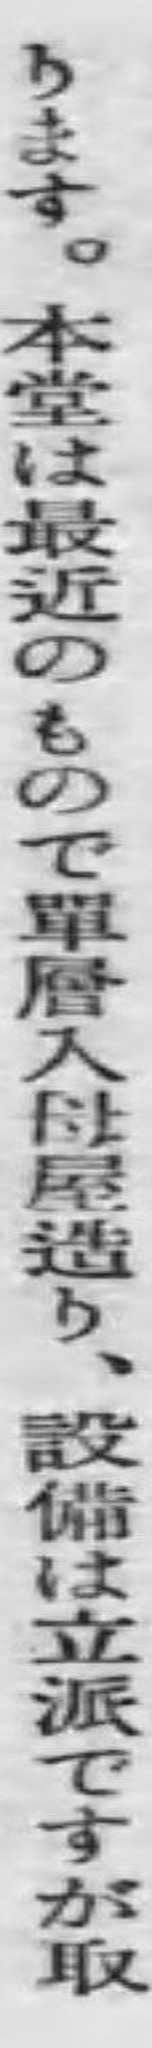ります。本堂は最近のもので単層入母屋造り、設備は立派ですが取
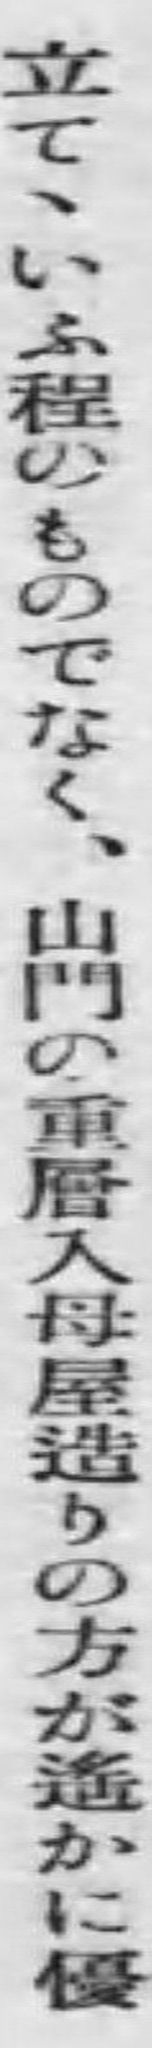立てゝいふ程のものでなく、山門の重層入母屋造りの方が遥かに優
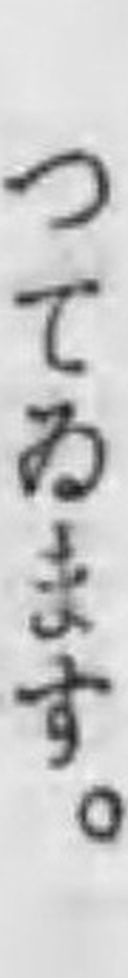つてゐます。
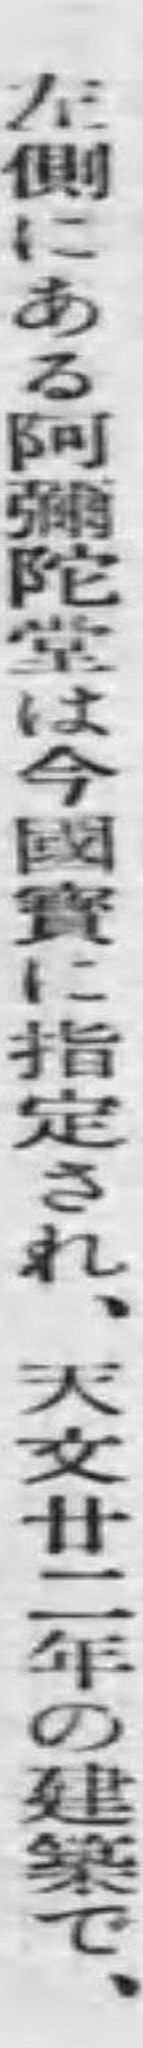左側にある阿弥陀堂は今国宝に指定され、天文廿二年の建築で、
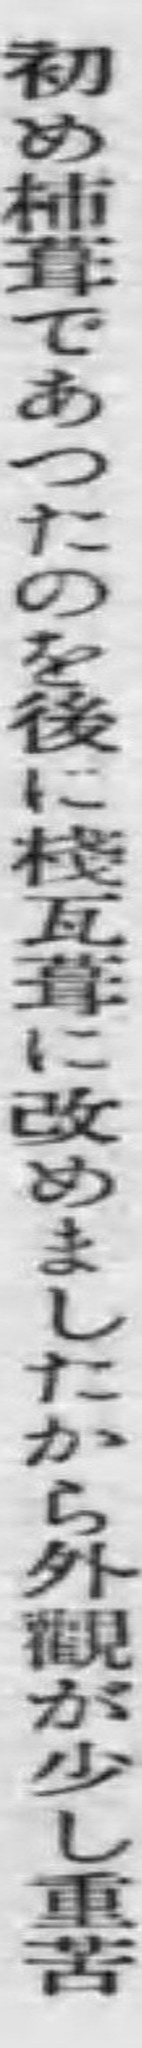初め杮葺であつたのを後に桟瓦葺に改めましたから外観が少し重苦
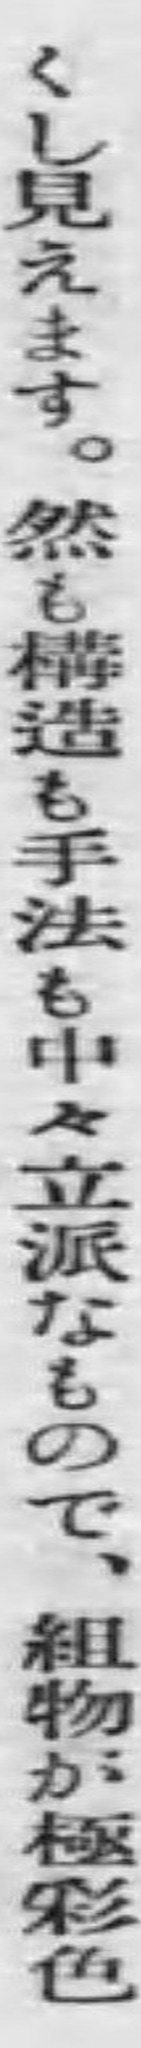くし見えます。然も構造も手法も中々立派なもので、組物が極彩色
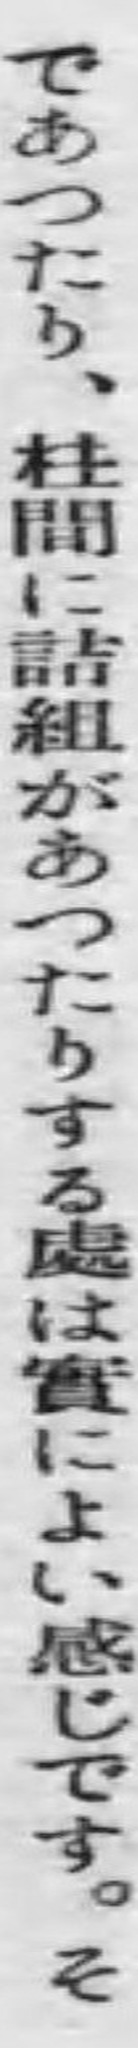であつたり、柱間に詰組があつたりする処は実によい感じです。そ
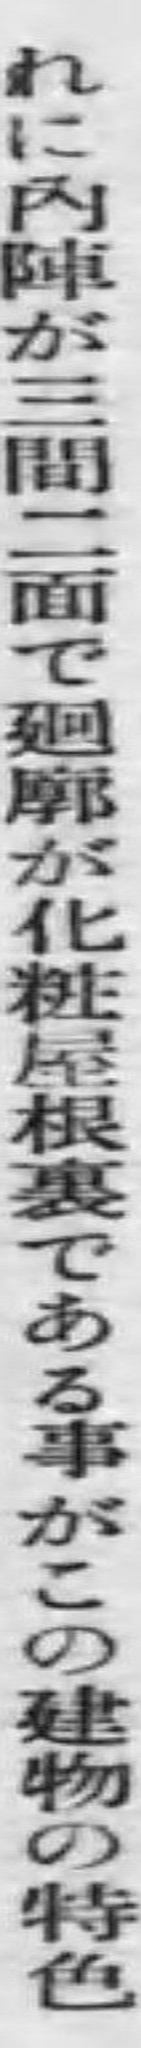れに内陣が三間二面で廻廊が化粧屋根裏である事がこの建物の特色
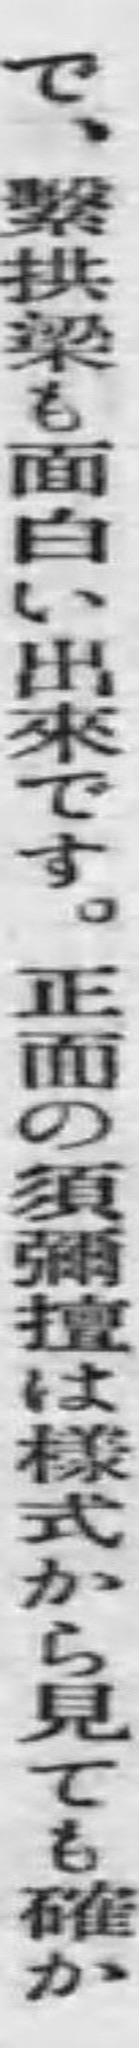で、繋拱梁も面白い出来です。正面の須弥擅は様式から見ても確か
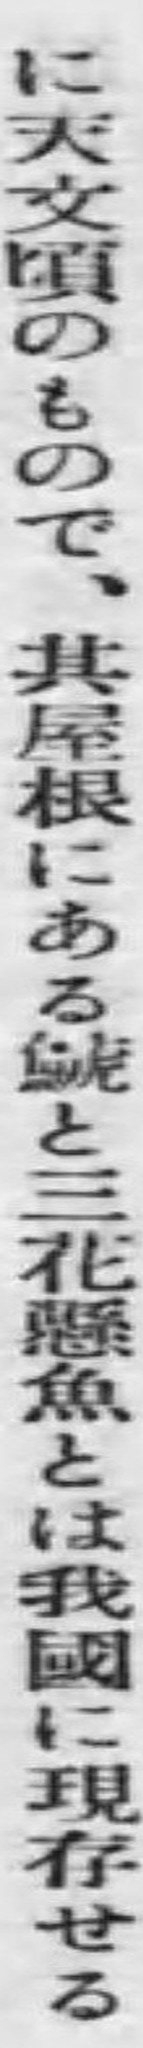に天文頃のもので、其屋根にある鯱と三花懸魚とは我国に現存せる
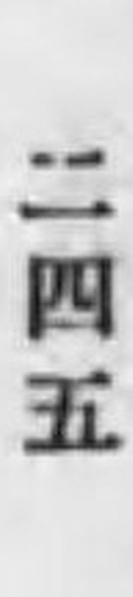二四五

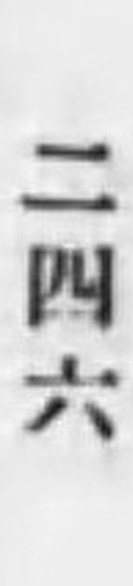二四六
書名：東三河道中記 : 豊橋市及其附近案内
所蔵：国立国会図書館 National Diet Library, JAPAN
